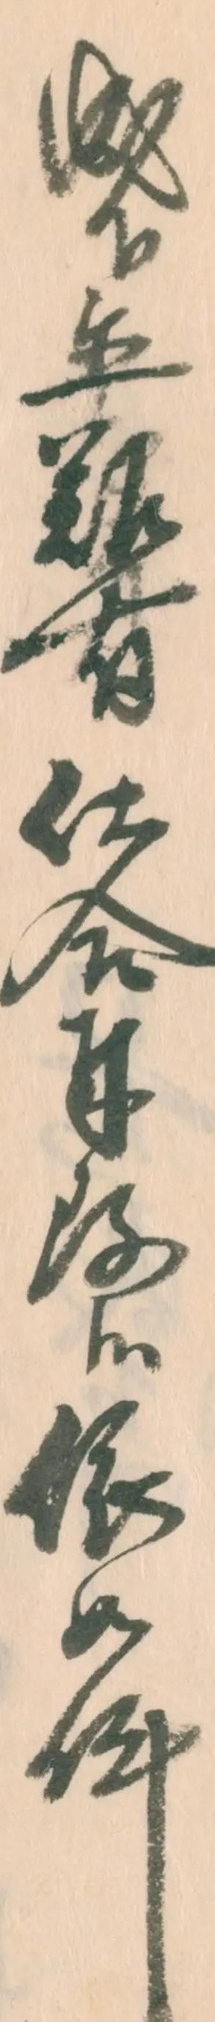成下置難有仕合奉存候依如件

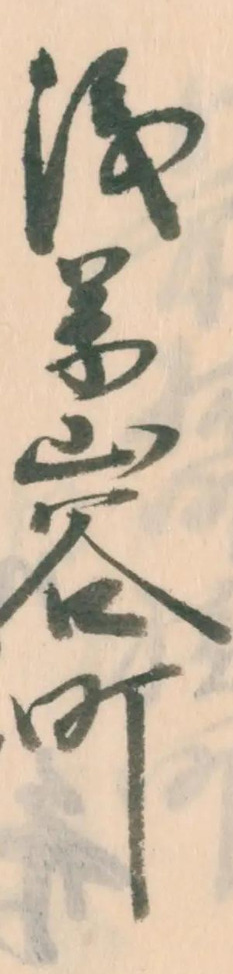浅草山谷町
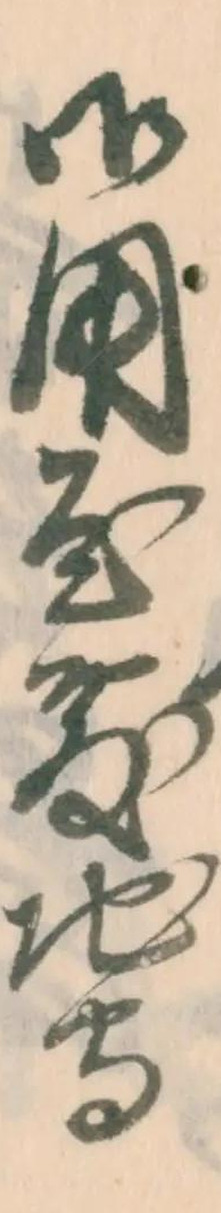御用屋敷地守
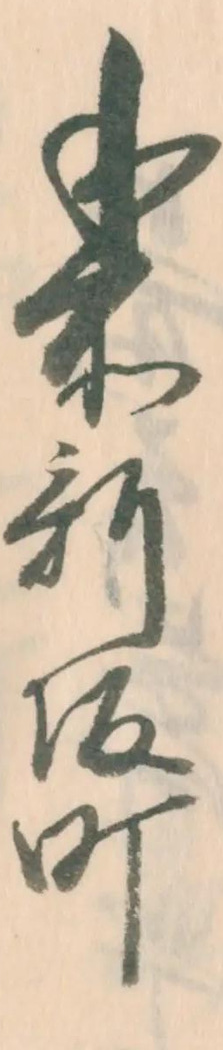本所新坂町
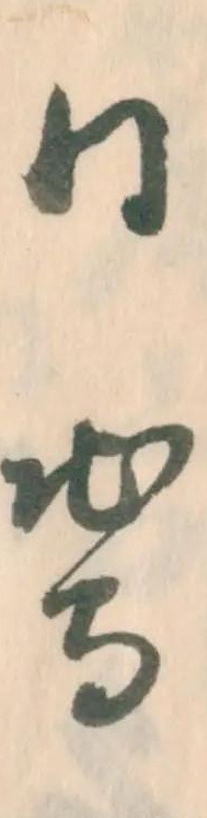同地守

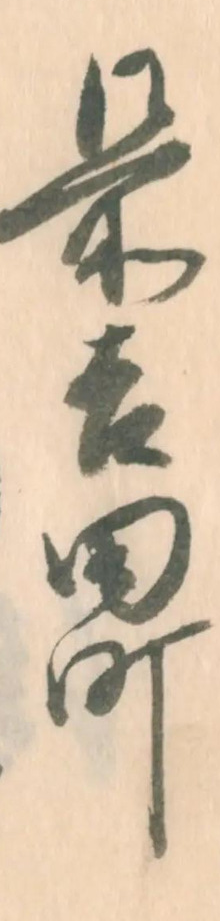同所吉田町
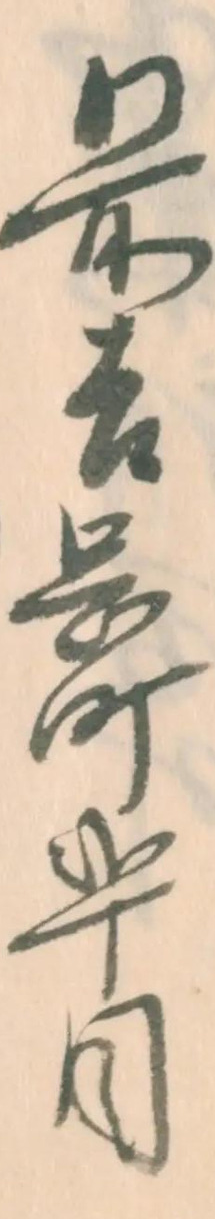同所吉岡町弐丁目
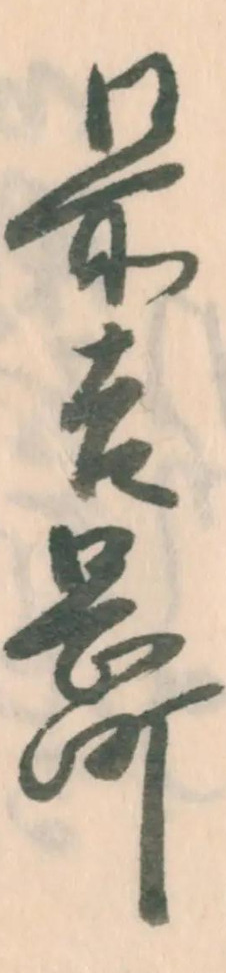同所吉岡町
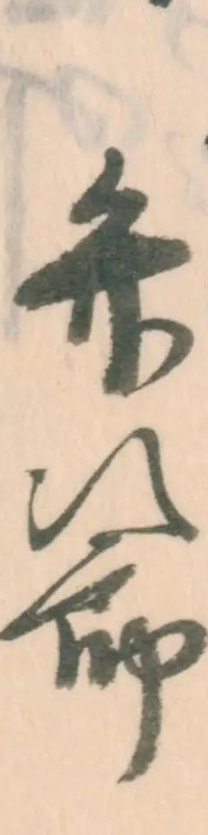弁次郎
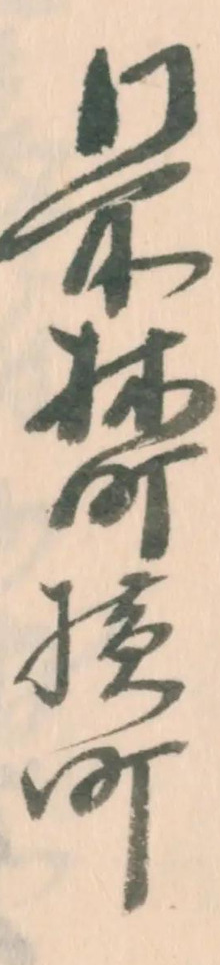同所林町横町
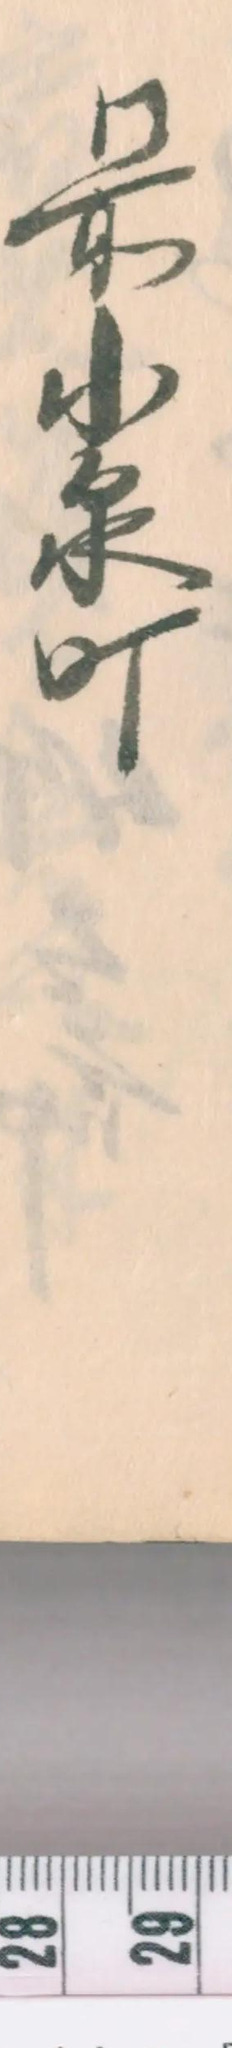同所小泉町
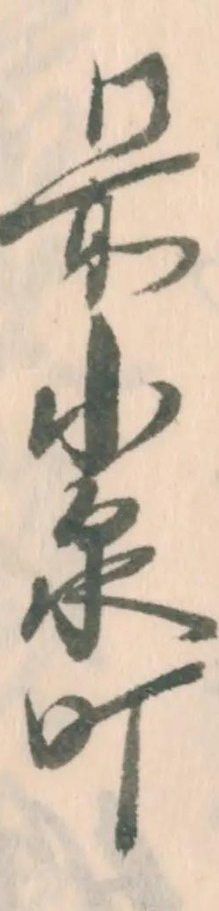同所小泉町
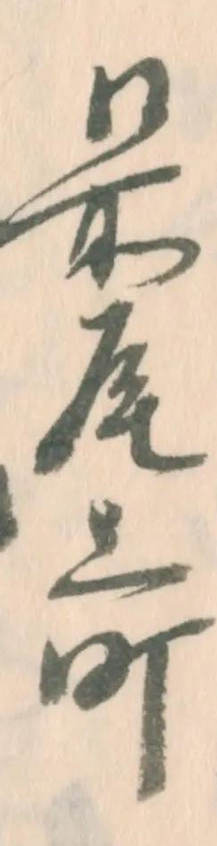同所尾上町
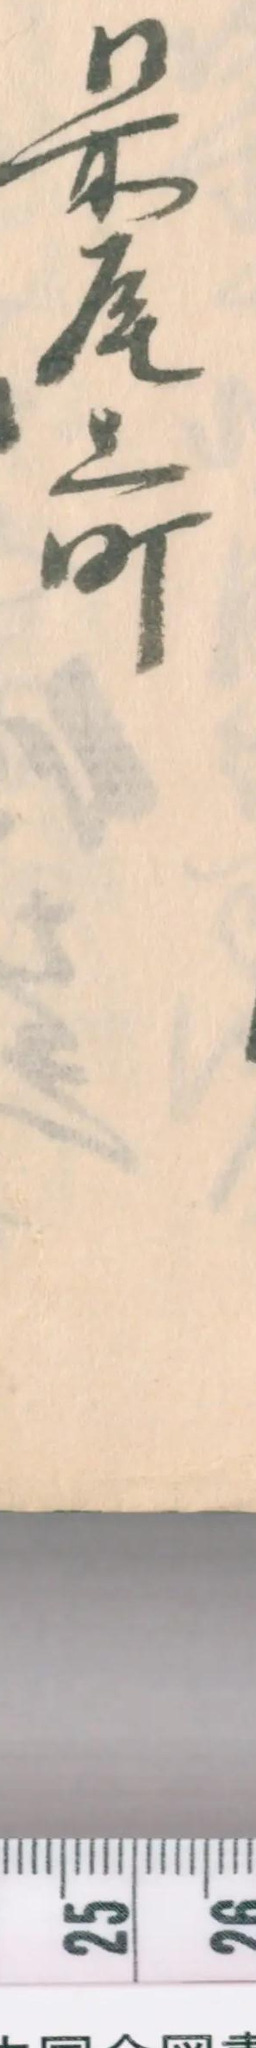同所尾上町

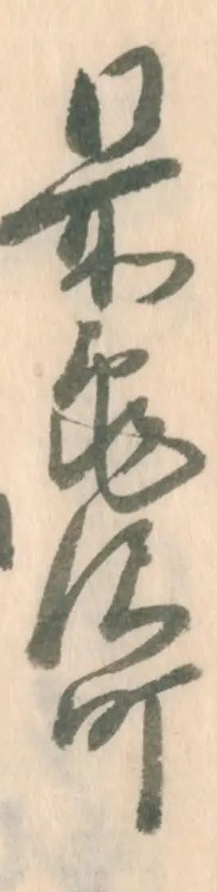同所亀沢町
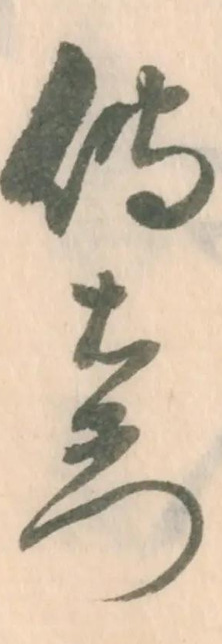伝右衛門
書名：地震災書留 2巻. [1] 内表紙に「地震災書留　安政二卯年　但本所深川御用屋敷地代免除調」とあり
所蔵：国立国会図書館 National Diet Library, JAPAN
